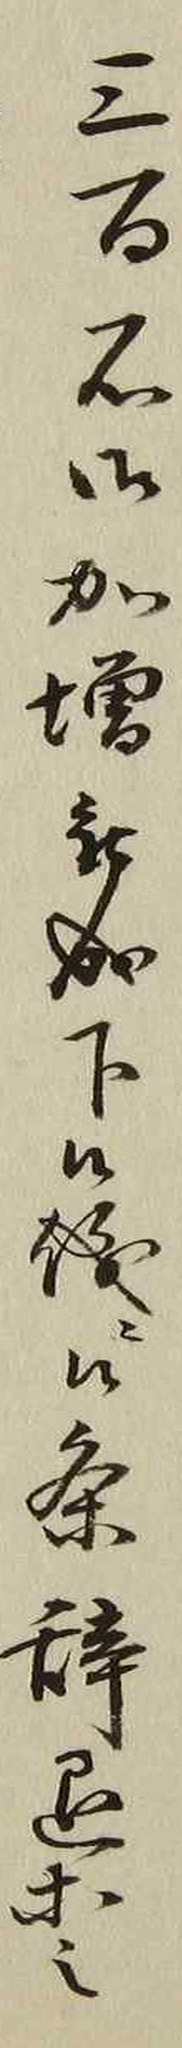三百石御加増被成下候儀に候条辞退等之
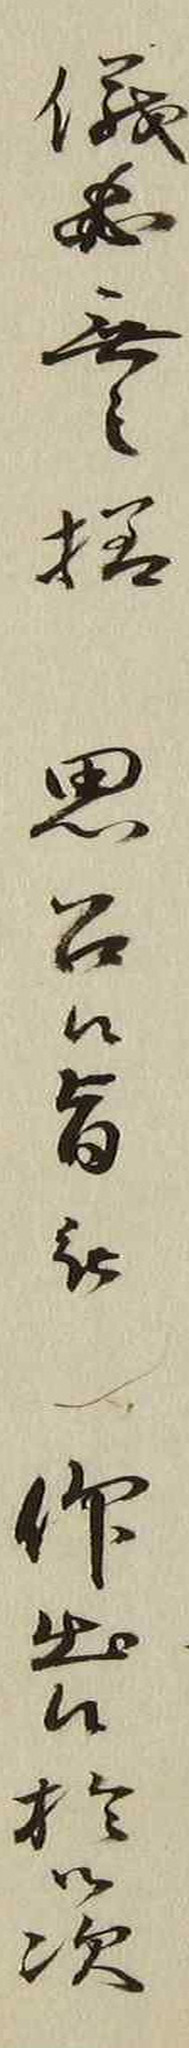儀も無之様思召候旨被仰出候於御次
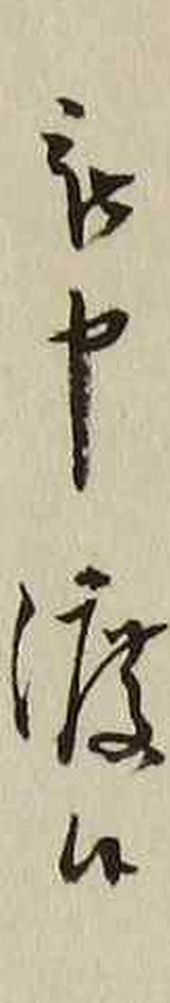被申渡候
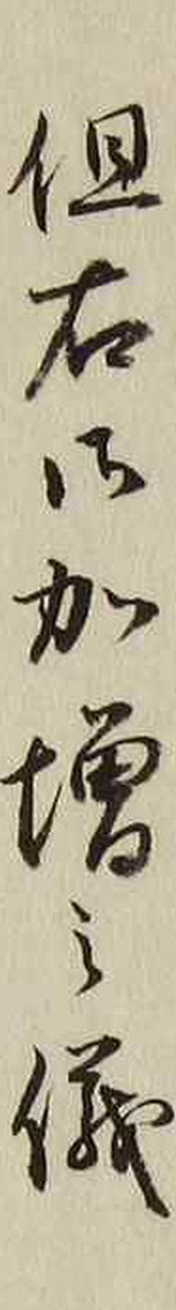但右御加増之儀
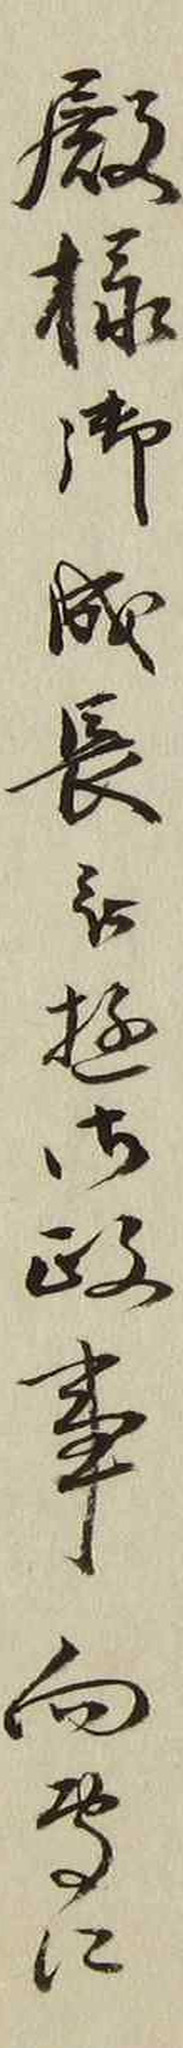殿様御成長被遊御政事向専に
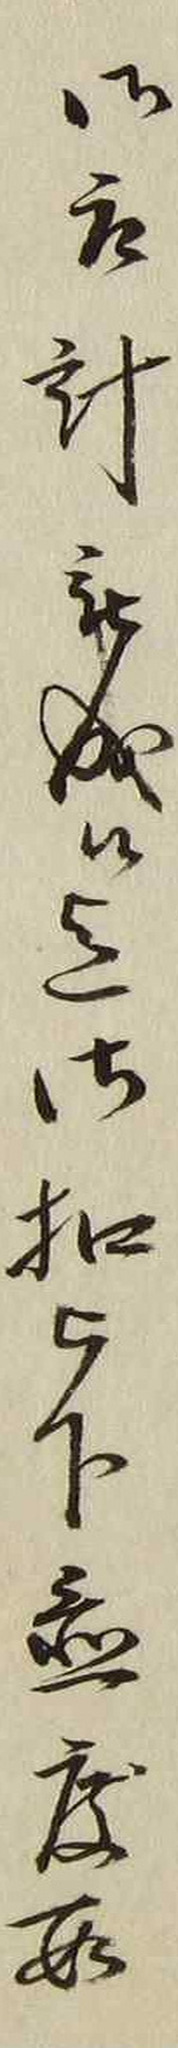御取計被成候迄御扣被下置度段
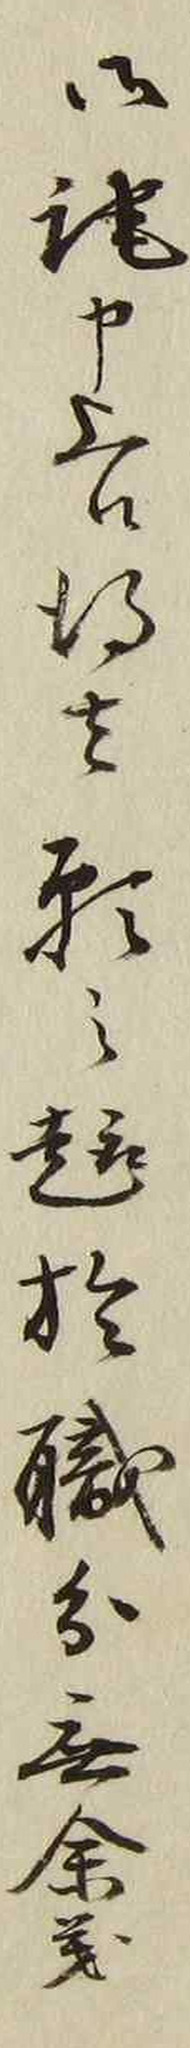御詫申上候得は願之趣於職分無余義
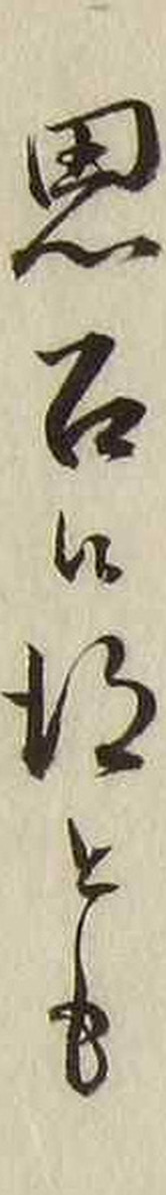思召候得とも
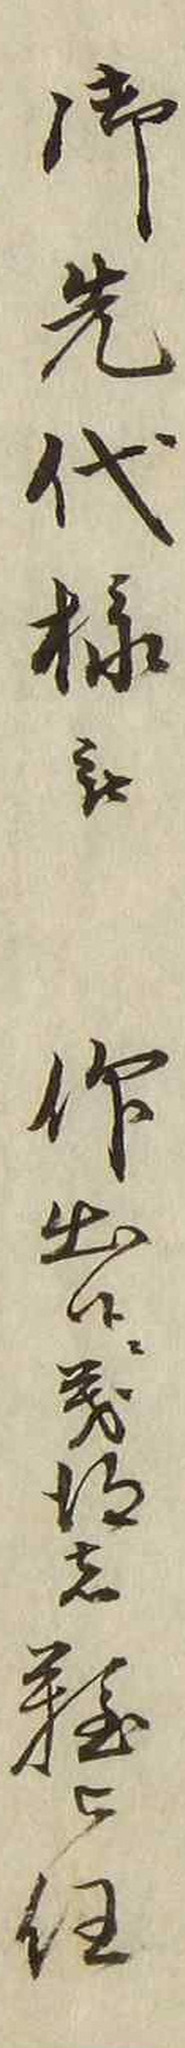御先代様被仰出候に義得は難被任

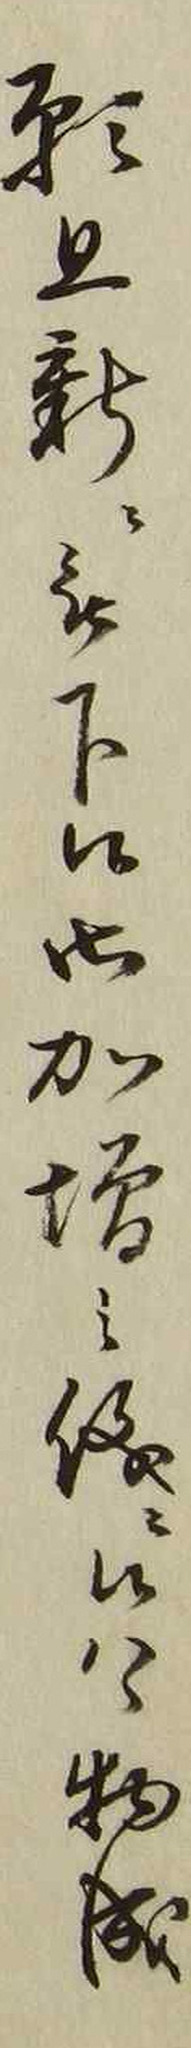願且新に被下置候御加増之儀に候はゝ物成
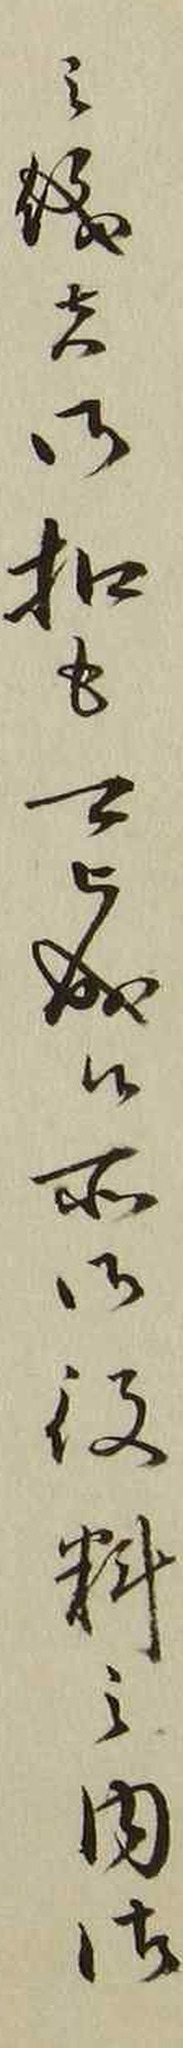之儀は御扣も可被成候所御役料之内御
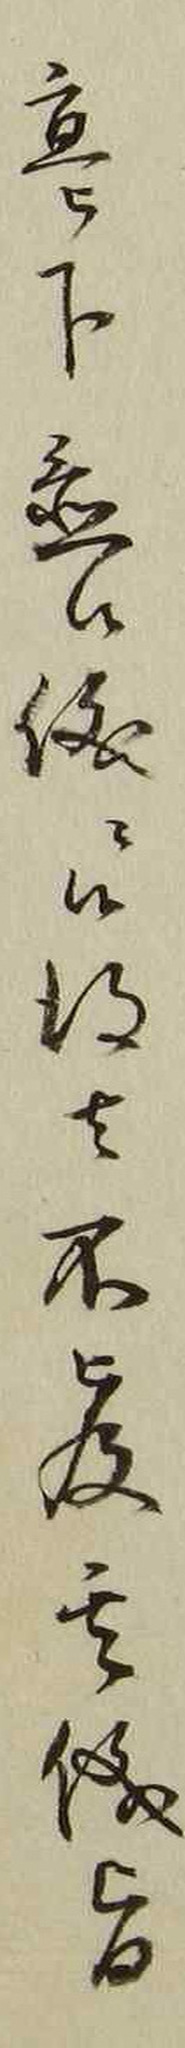立被下置候儀に候得ハ不被及其儀旨
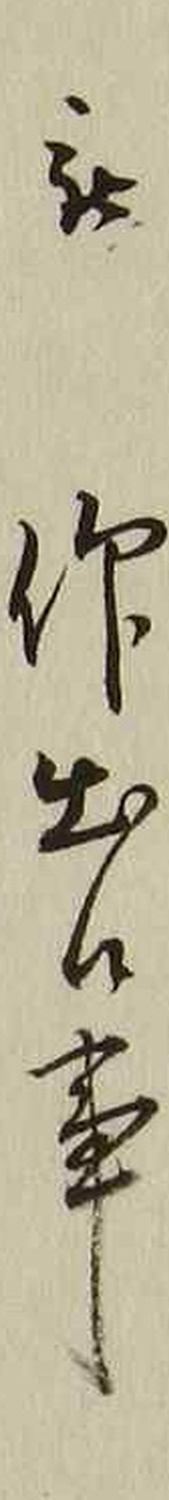被仰出候事
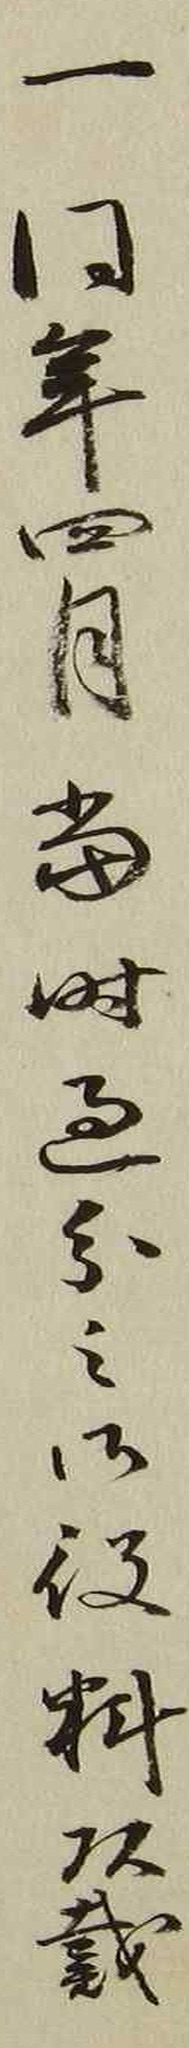一同年四月当時過分之御役料頂戴
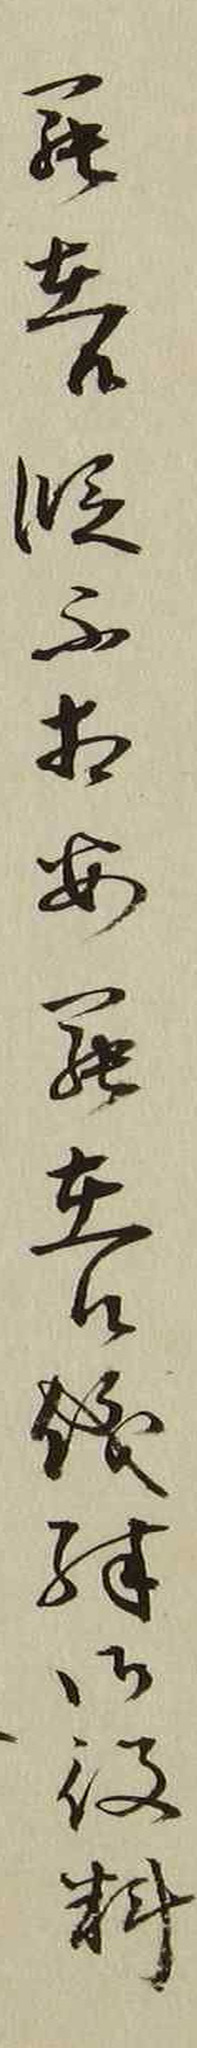罷在候段不相安罷在候儀殊御役料
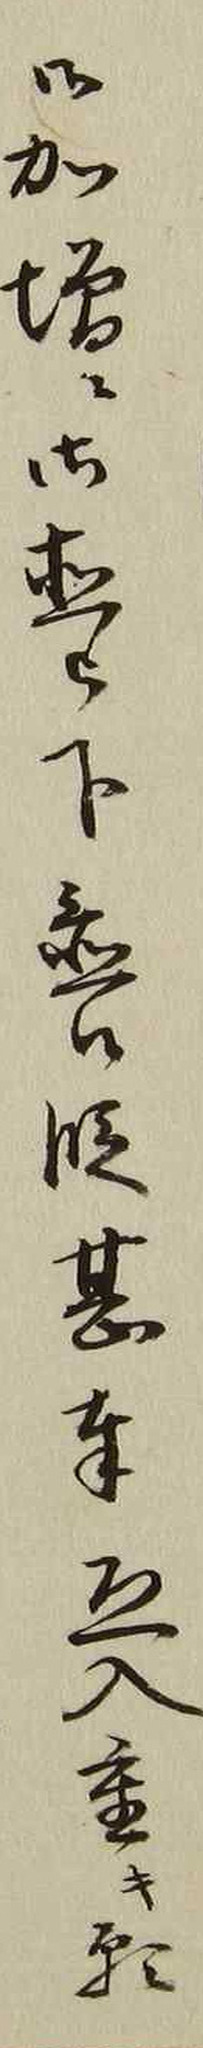御加増に御直被下置候段甚奉恐入重き願
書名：諸士系譜　巻之125　た之部1
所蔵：会津若松市立会津図書館
